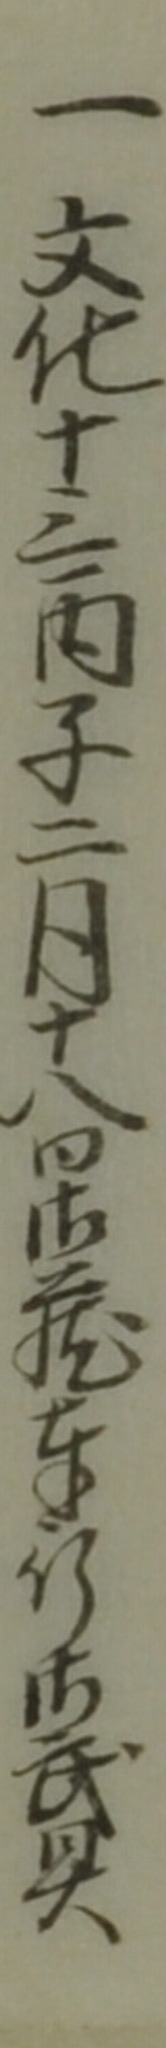一文化十三丙子二月十八日御蔵奉行御武具
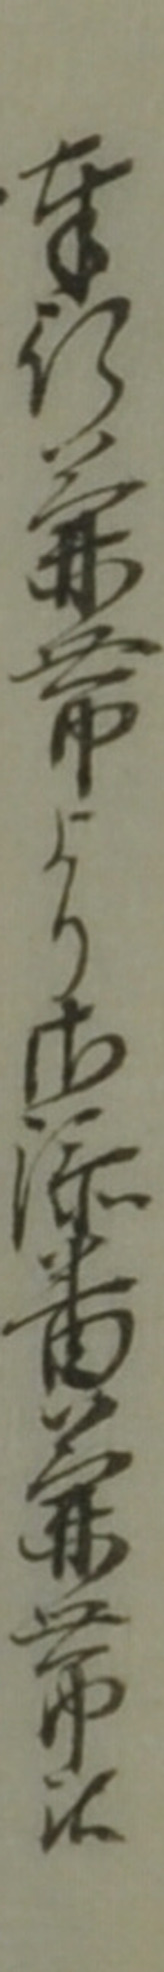奉行兼帯より御添番兼帯被
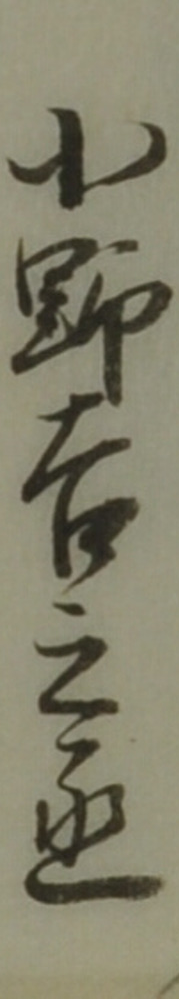小野吉之丞
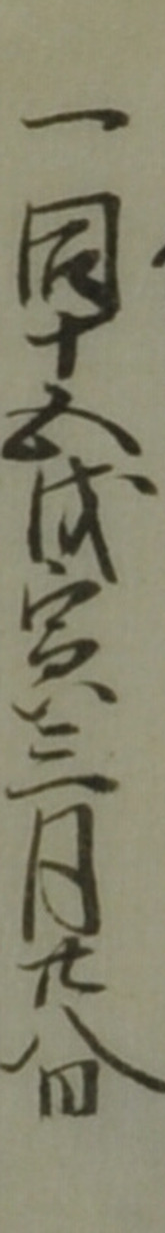一同十五戊寅三月廿八日
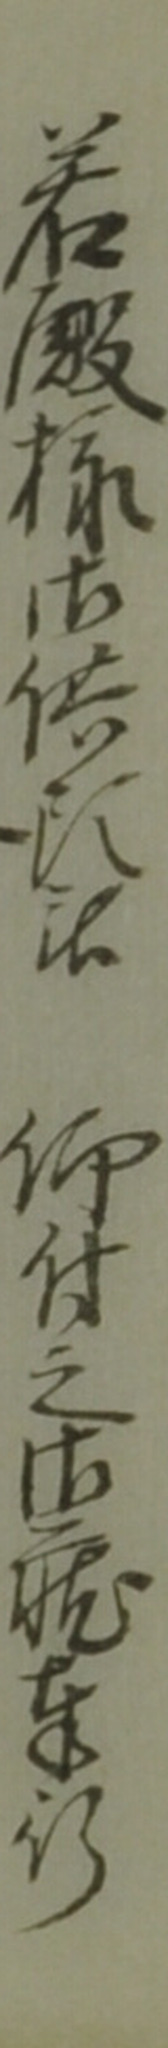若殿様御供頭被仰付之御蔵奉行
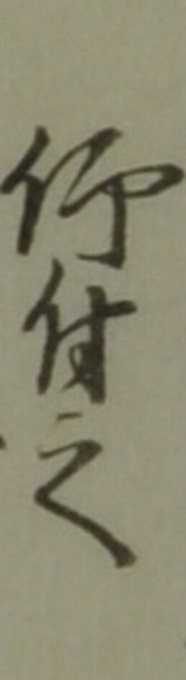仰付之
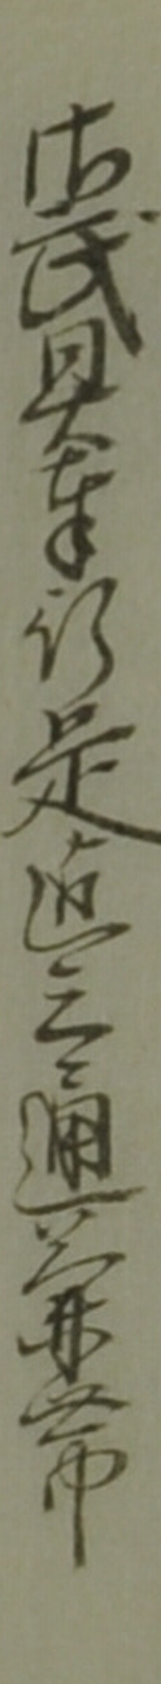御武具奉行是迄之通兼帯
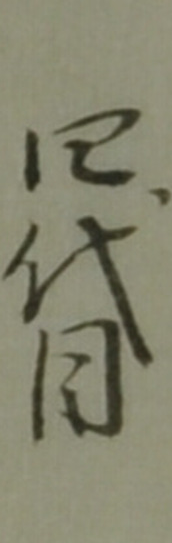四代目
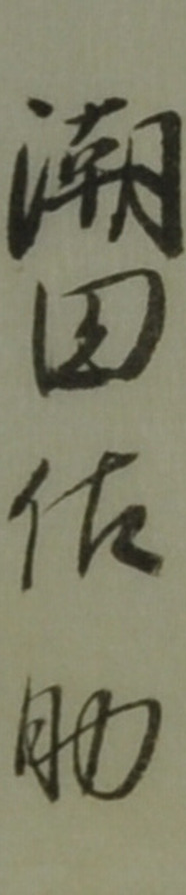潮田佐助
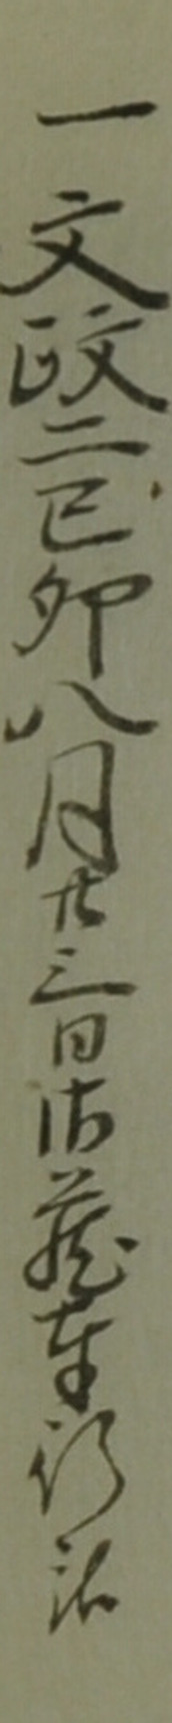一文政二巳卯八月廿三日御蔵奉行被
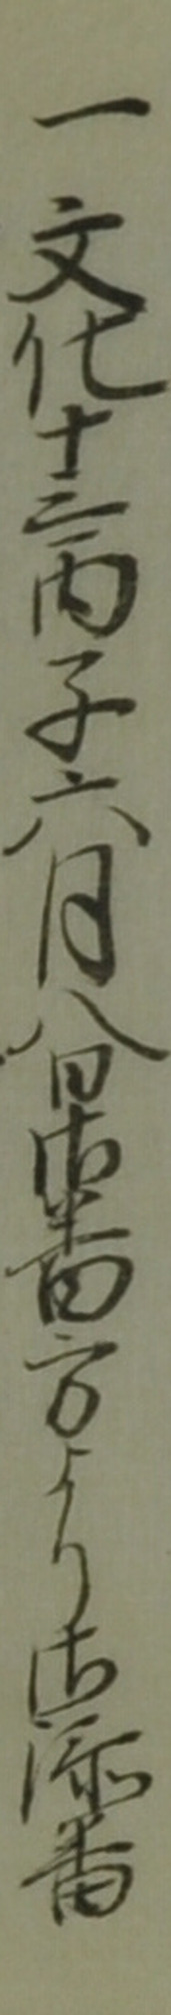一文化十三丙子六月八日御番方より御添番
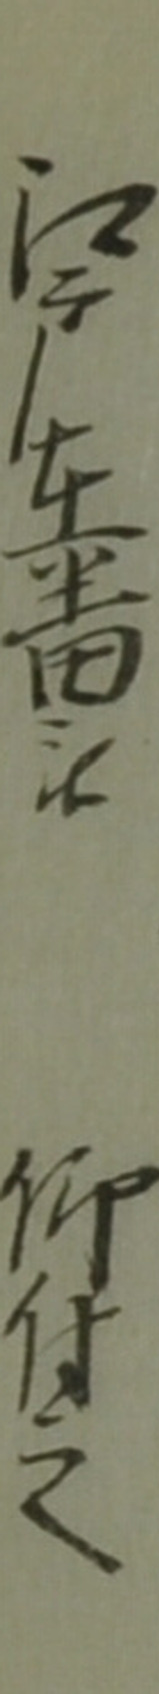江戸在番被仰付之

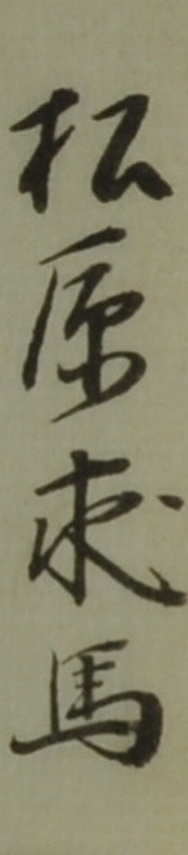松原求馬
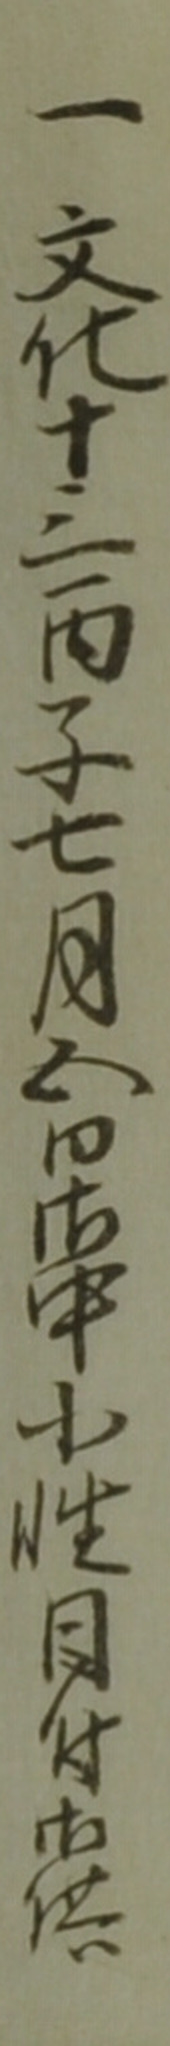一文化十三丙子七月五日御中小性目付御供
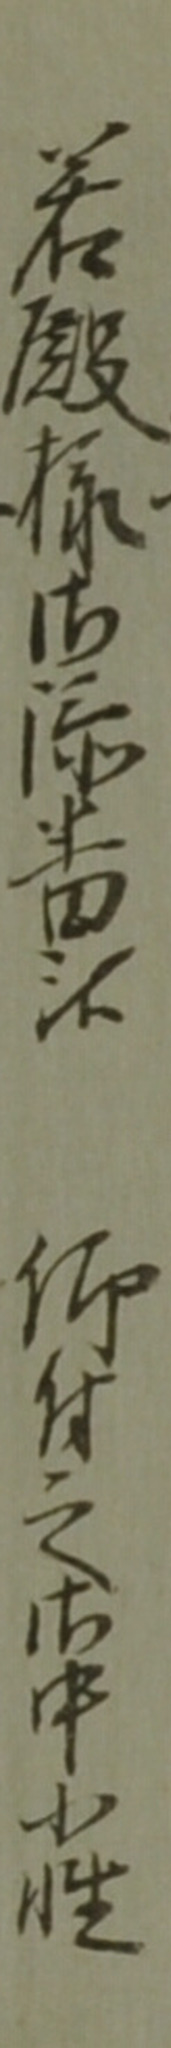若殿様御添番被仰付之御中小性
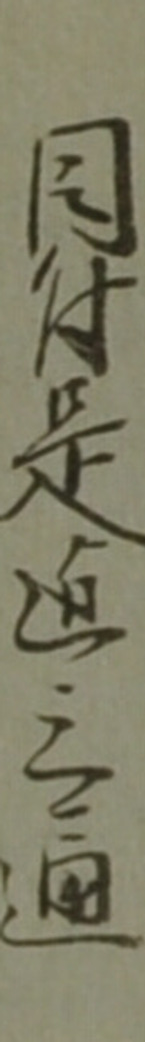目付是迄之通
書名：諸御役代々録（八）
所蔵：伊那市立高遠町図書館・合同会社AMANE
